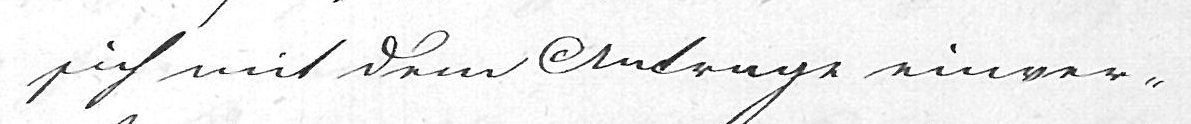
sich mit den Antrage einver-
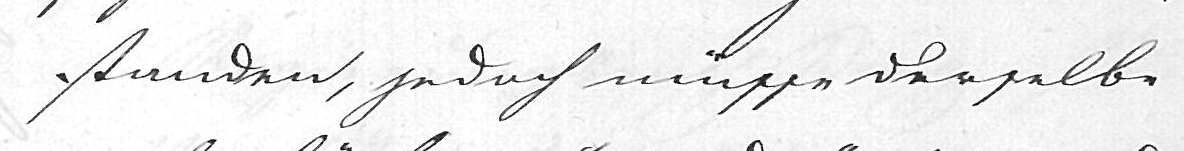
standen, jedoch müsse derselbe
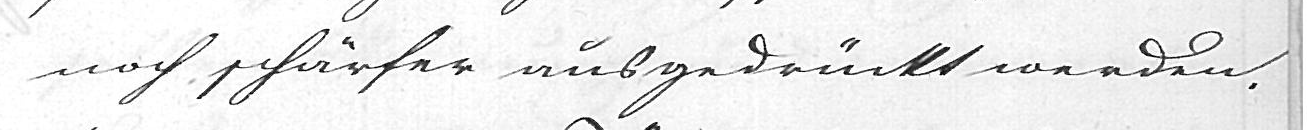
noch schärfer ausgedrückt werden.
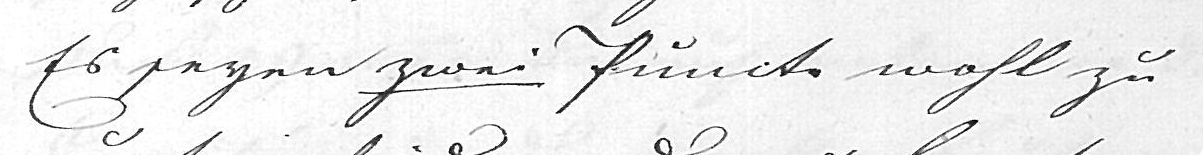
Es seyen zwei Puncte wohl zu
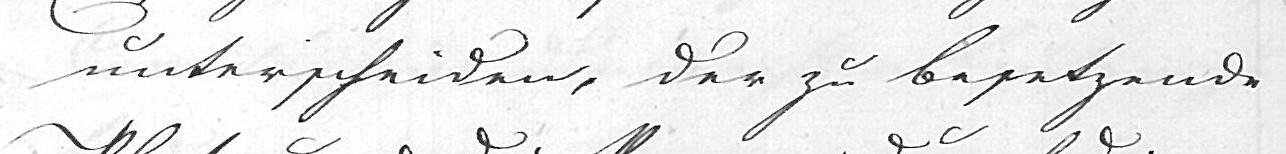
unterscheiden, der zu besetzende
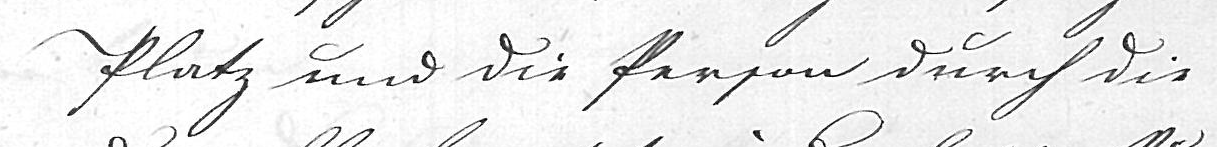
Platz und die Person durch die
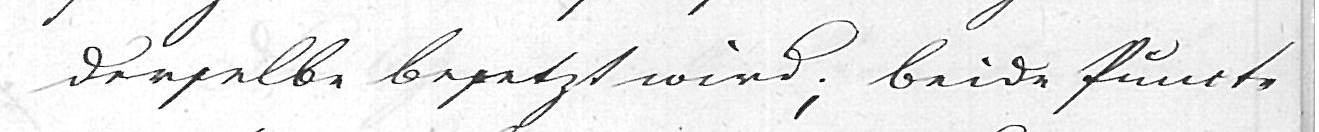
derselbe besetzt wird; beide Puncte
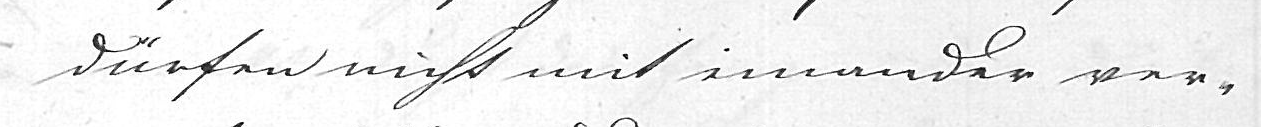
dürfen nicht mit einander ver-
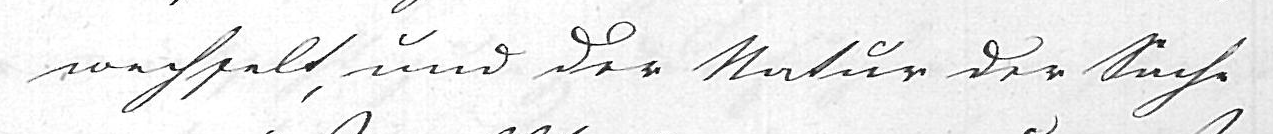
wechselt, und der Natur der Sache
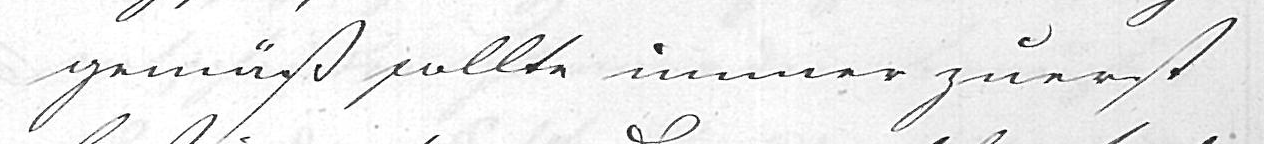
gemäß sollte immer zuerst
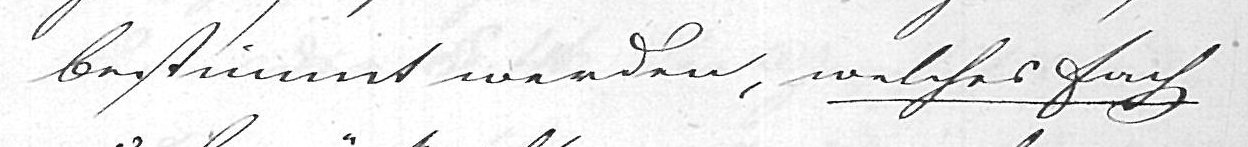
bestimmt werden, welches Fach
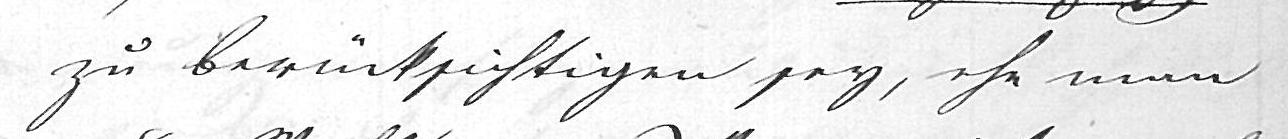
zu berücksichtigen sey, ehe man
